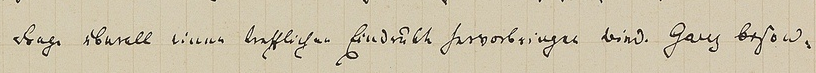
Frage überall einen trefflichen Eindrukk hervorbringen wird. Ganz beson-
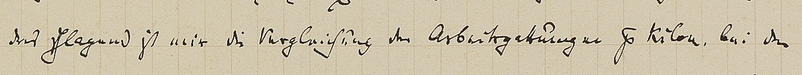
ders schlagend ist mir die Vergleichung der Arbeitsgattungen je Kilom. bei den
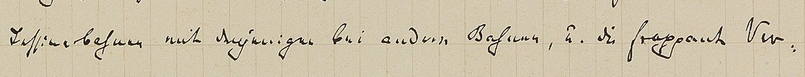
Tessinerbahnen mit denjenigen bei andern Bahnen, u. die frappante Ver-
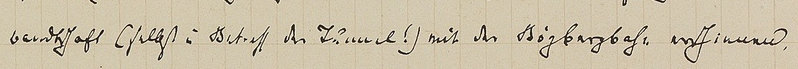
wandtschaft (selbst in Betreff der Tunnel!) mit der Bözbergbahn erschienen.
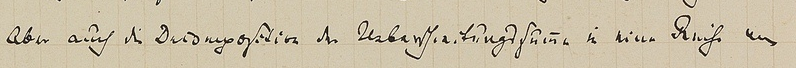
Aber auch die Decomposition der Ueberschreitungssumme in eine Reihe von
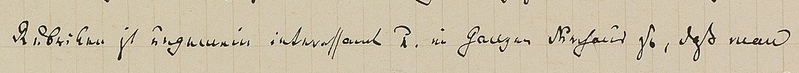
Rubriken ist ungemein interessant u. im Ganzen durchaus so, daß man
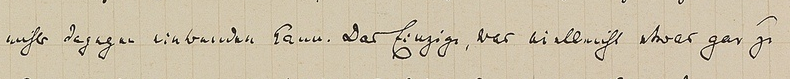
nichts dagegen einwenden kann. Das Einzige, was vielleicht etwas gar zu
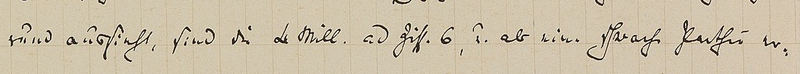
rund aussieht, sind die 4 Mill. ad Ziff. 6, u. als eine schwache Parthie er-
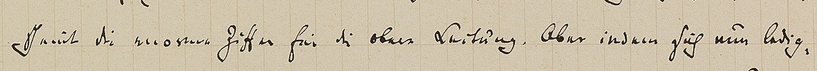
scheint die enorme Ziffer für die obere Leitung. Aber indem sich nun ledig-
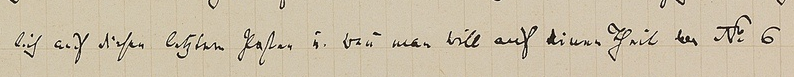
lich auf diesen letzten Posten u. wenn man will auf einen Theil von No 6
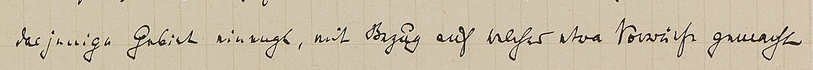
dasjenige Gebiet einengt, mit Bezug auf welches etwa Vorwürfe gemacht
